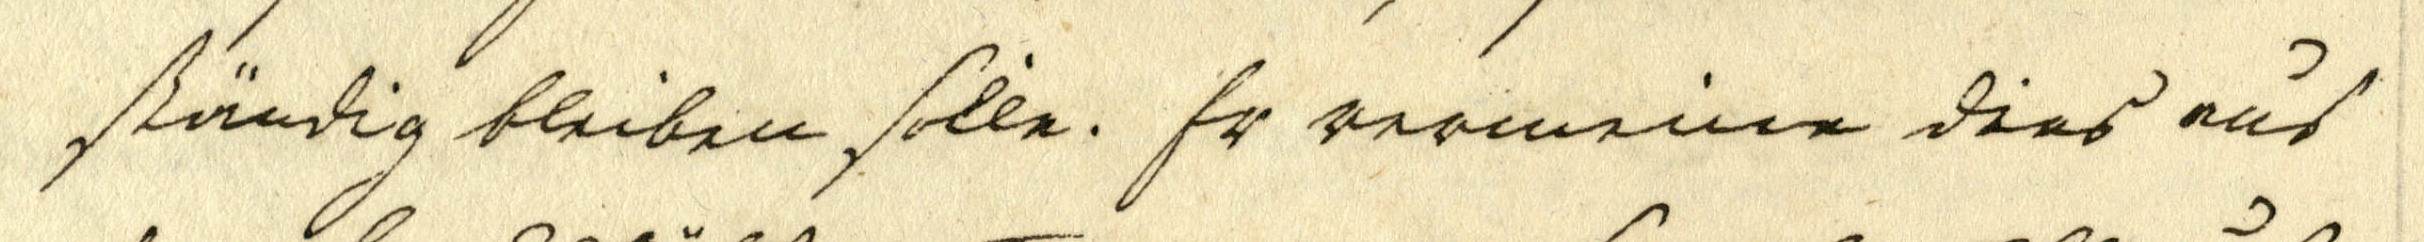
ständig bleiben solle. Er vermeine dies aus
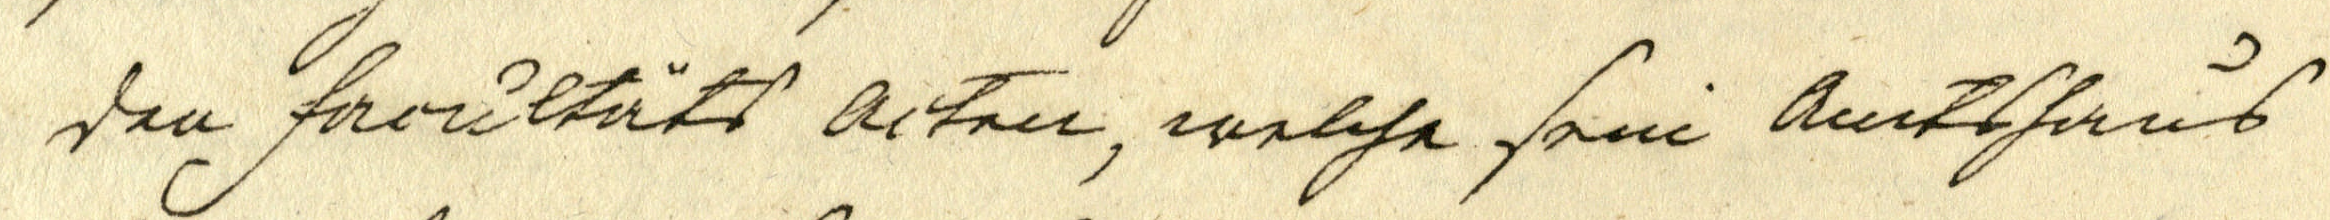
den Facultäts Acten, welche sein Amtshaus
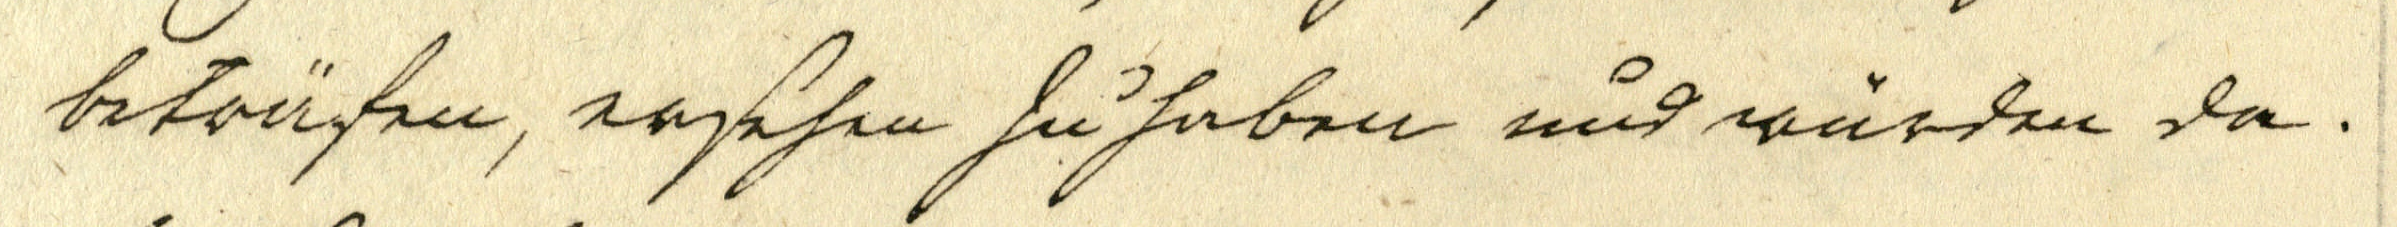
beträfen, ersehen zu haben und würden da¬
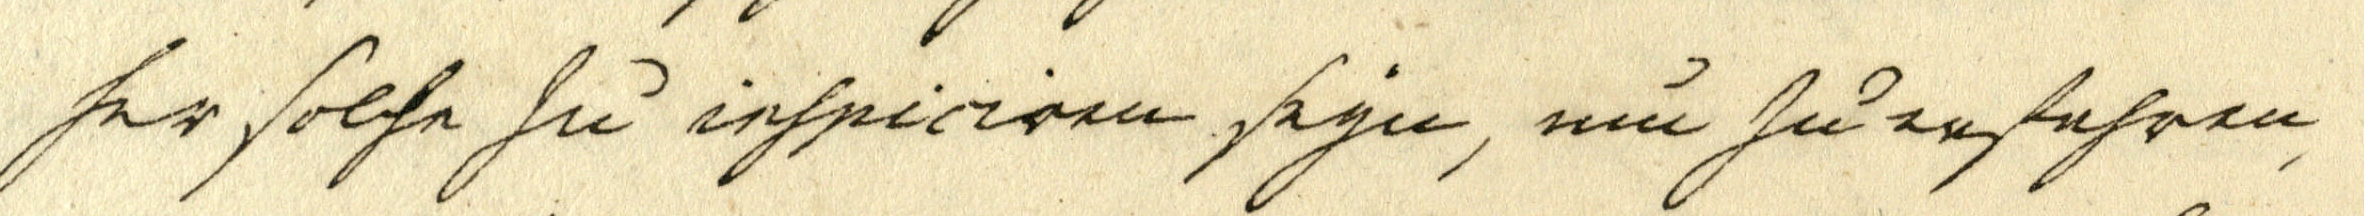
her solche zu inspiciren seÿn, um zu erfahren,
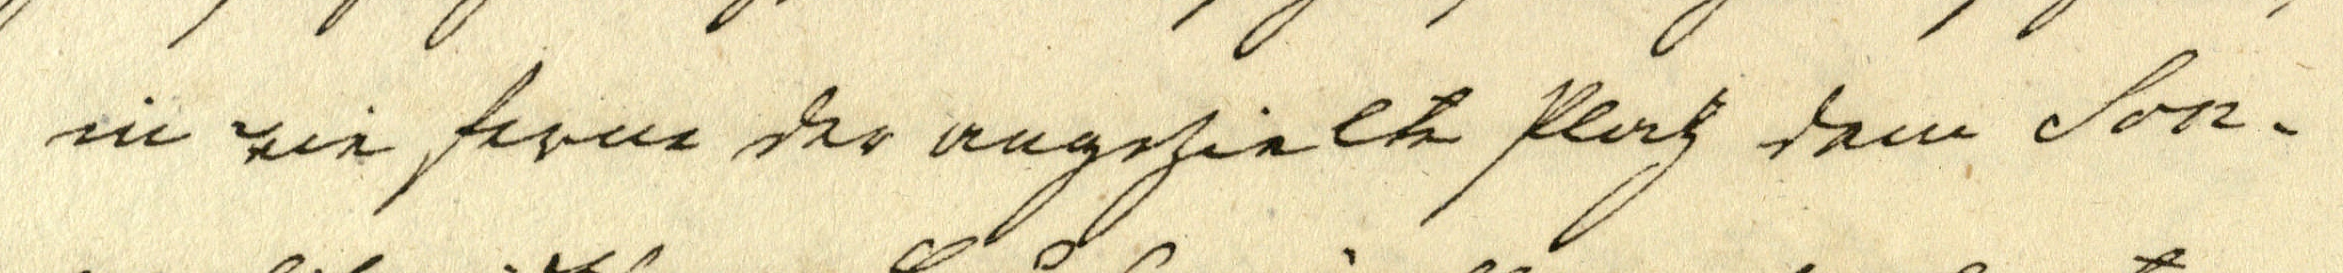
in wie ferne der angezielte Platz dem Son¬
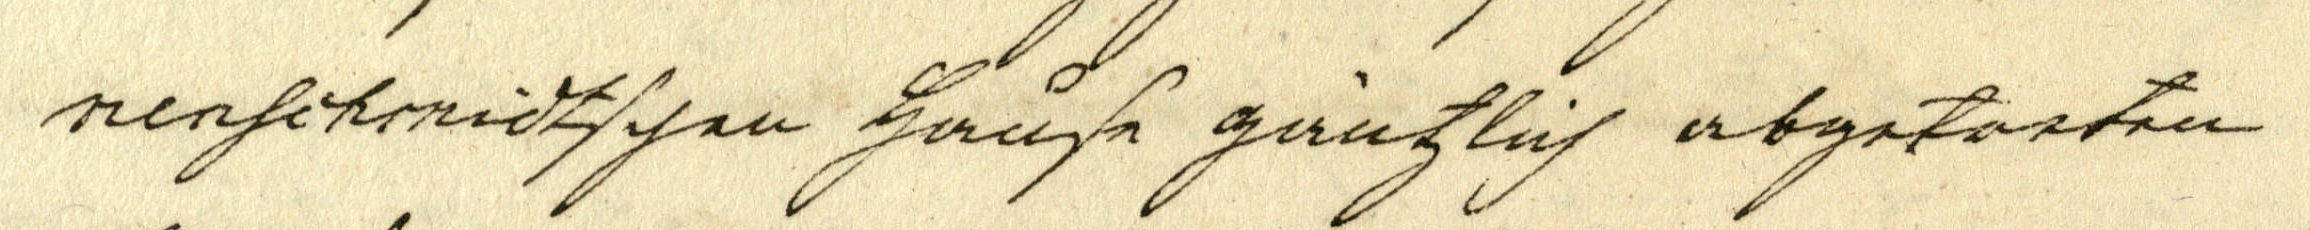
nenschmidtschen hause gäntzlich abgetreten
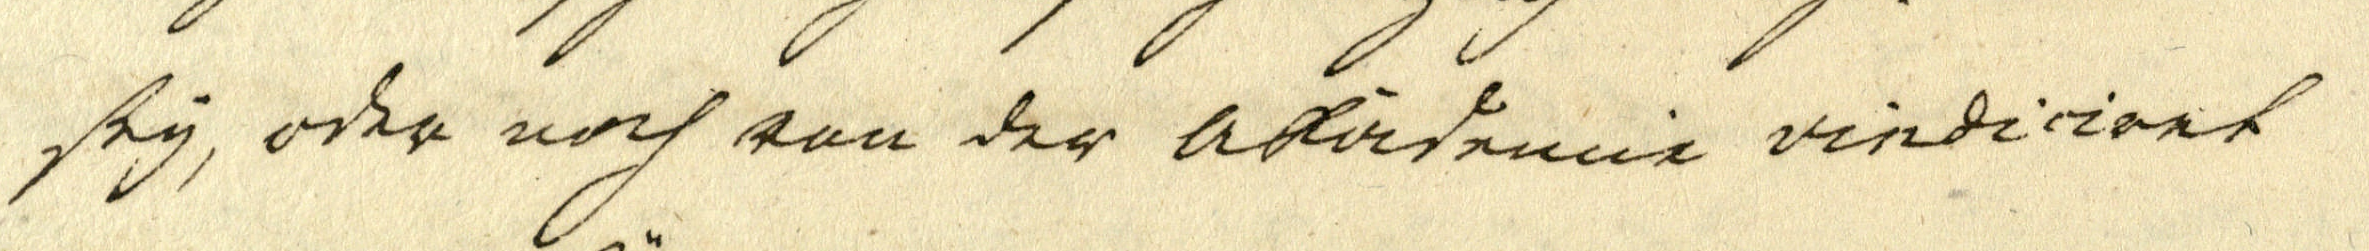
seÿ, oder noch von der Akademie vindiciret
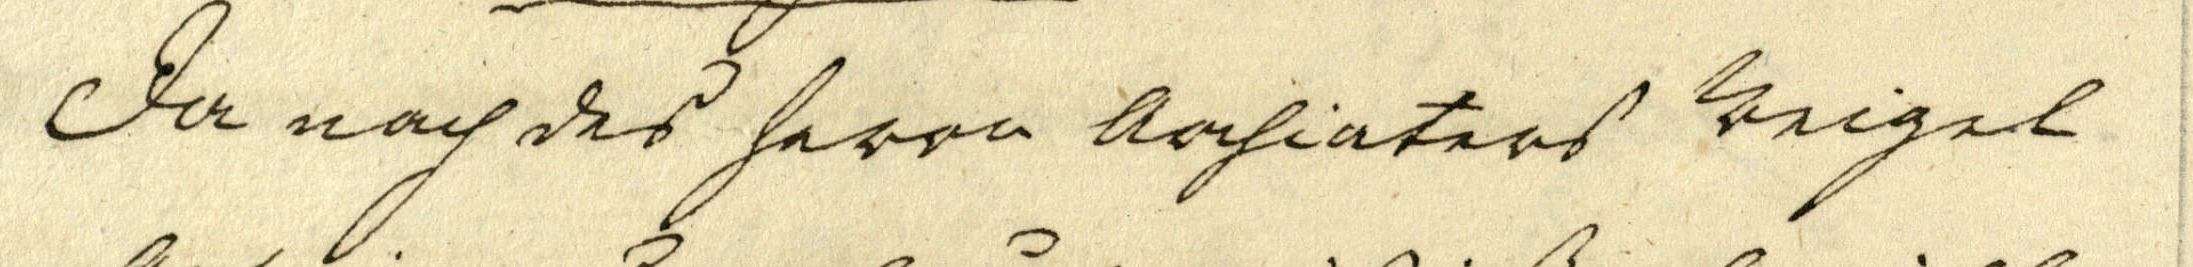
Da nach des herrn Archiaters Weigel
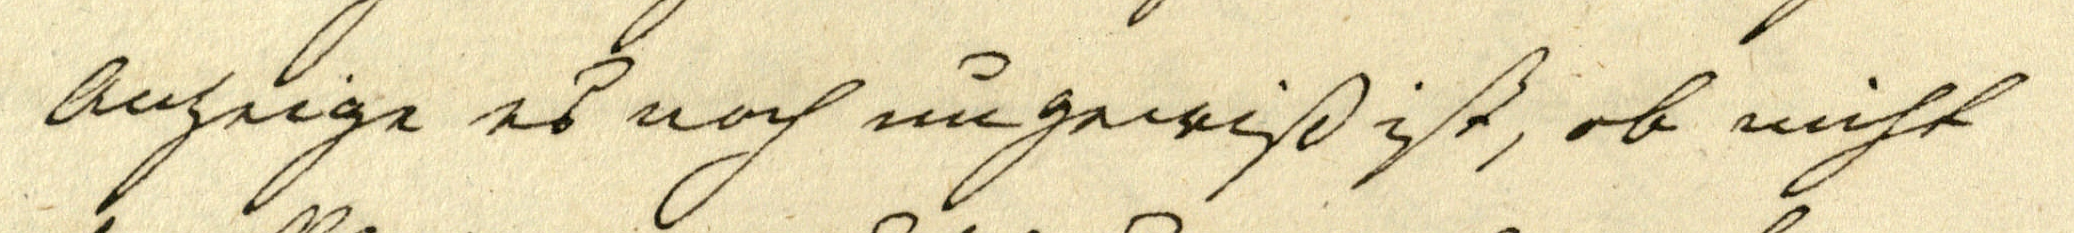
Anzeige es noch ungewiß ist, ob nicht
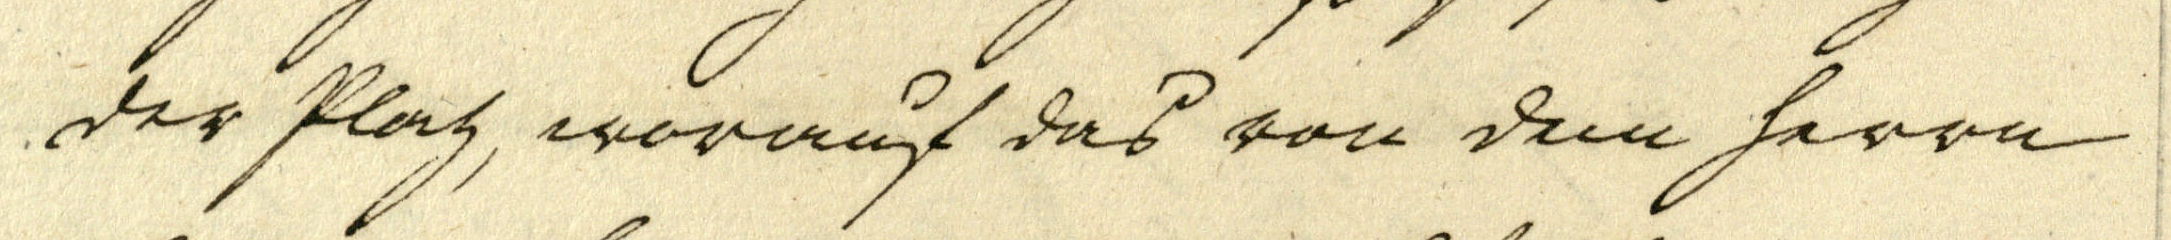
der Platz, worauf das von dem herrn
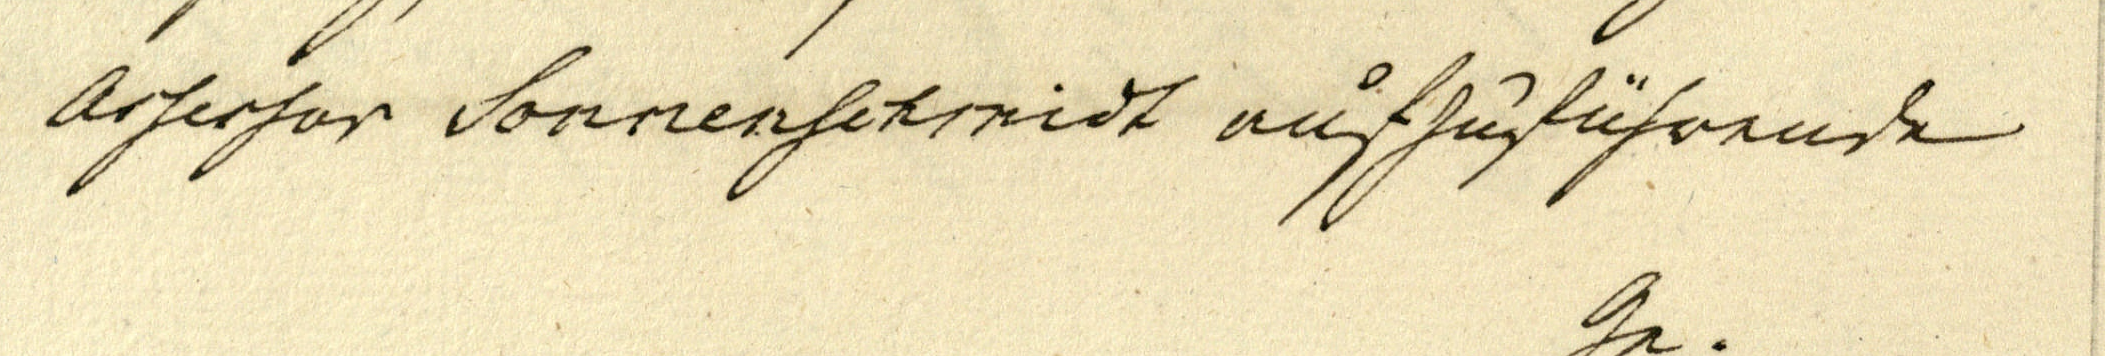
Assessor Sonnenschmidt aufzuführende
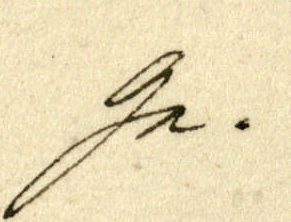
Ge.
